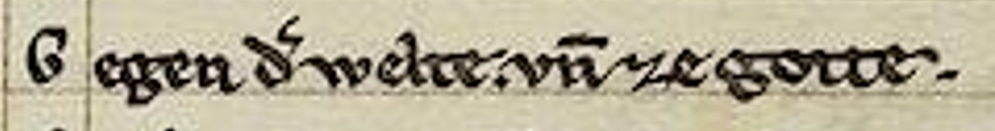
Gegen d(er) welte. vn(d) ze gotte.
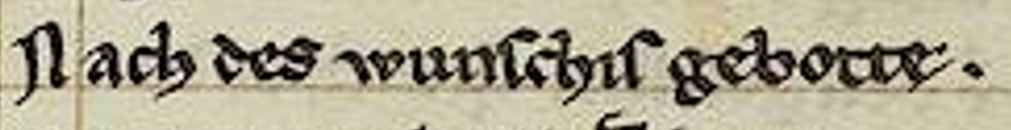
Nach des wunſchiſ gebotte.
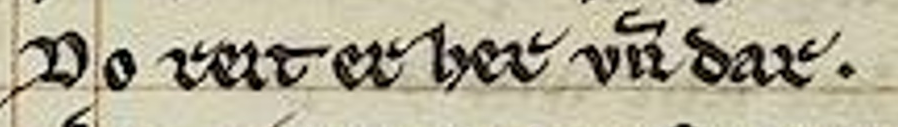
Do reit er her vn(d) dar.
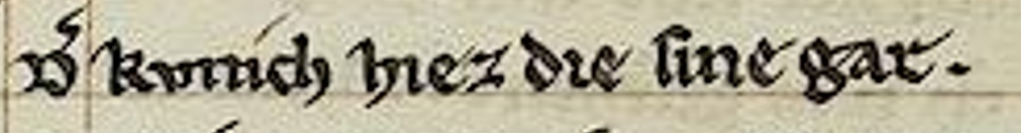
D(er) kvnich hiez die ſine gar.
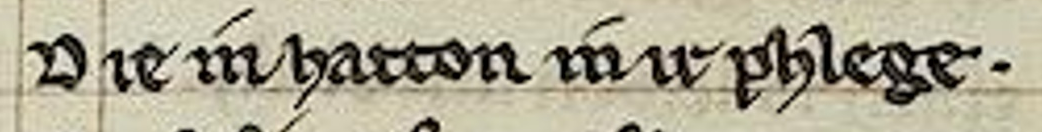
Die in hatton in ir phlege.
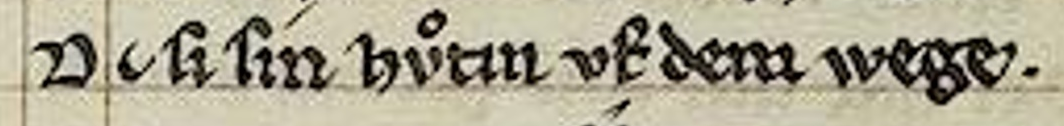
D(az) ſi ſin hv°otin vf dem wege.
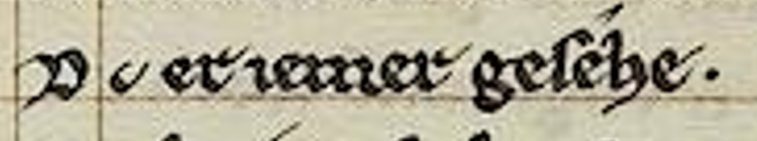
D(az) er iemer geſehe.
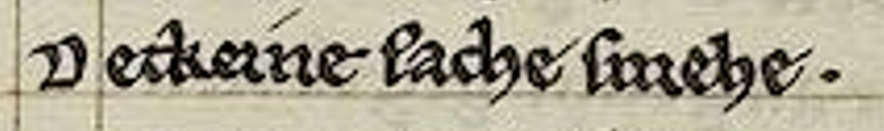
Deckeine ſache ſmehe.
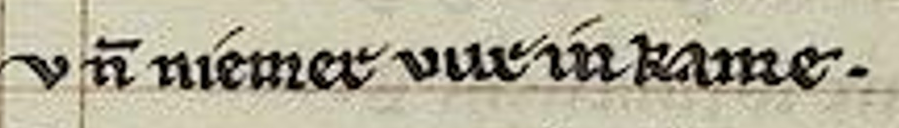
Vn(d) niemer vur in kame.
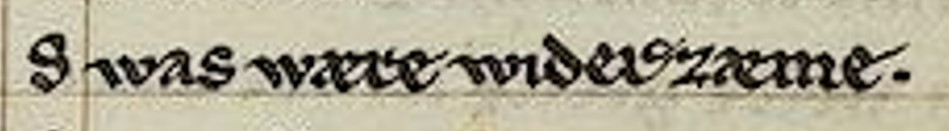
Swas w[ae]re widerz[ae]me.
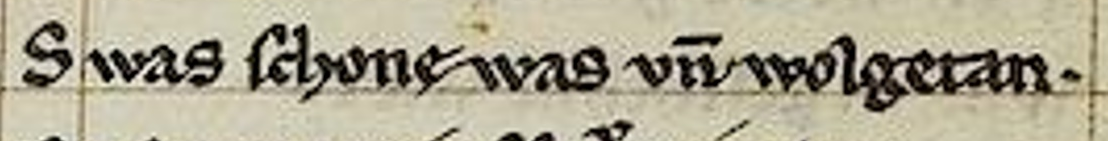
Swas ſchone was vn(d) wolgetan.
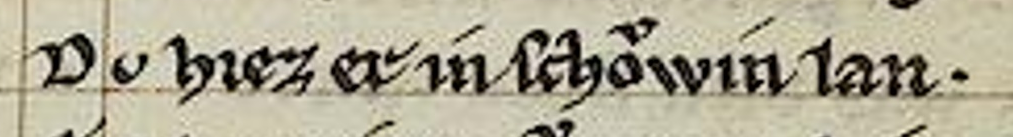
D(az) hiez er in ſcho°vwin lan.
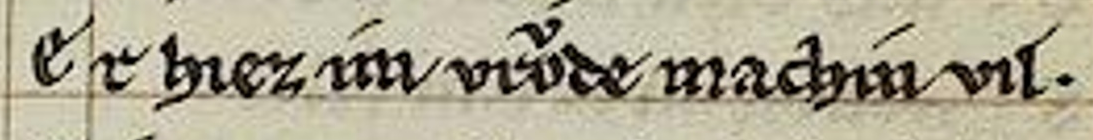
Er hiez im vro°vde machin vil.
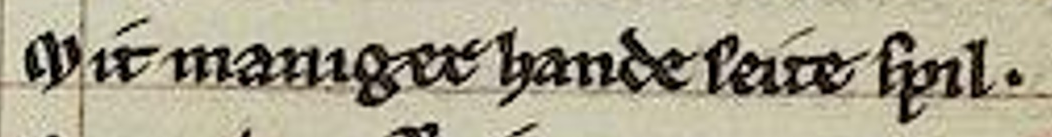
Mit maniger hande ſeite ſpil.
